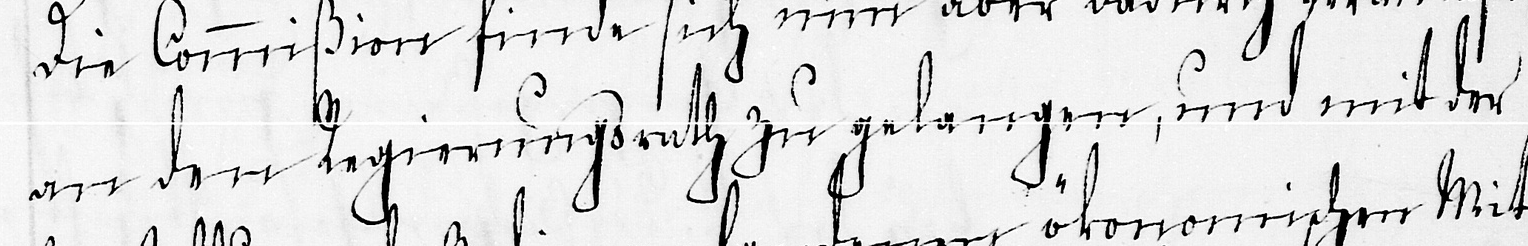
an den Regierungsrath zu gelangen, und mit der
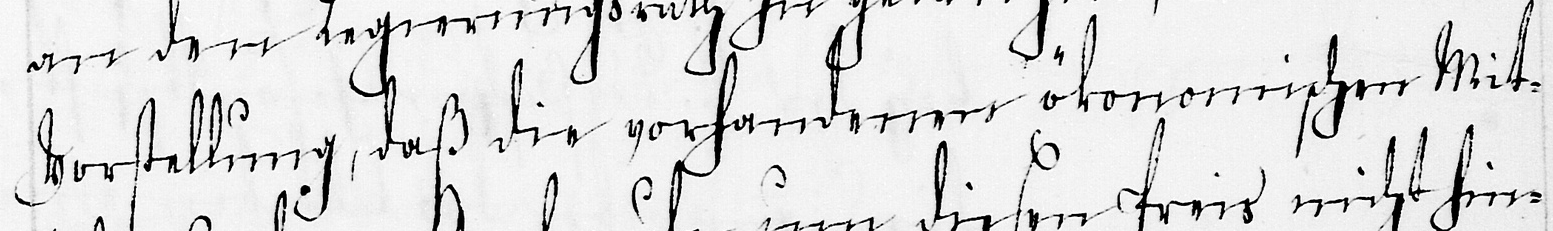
Vorstellung, daß die vorhandenen ökonomischen Mit¬
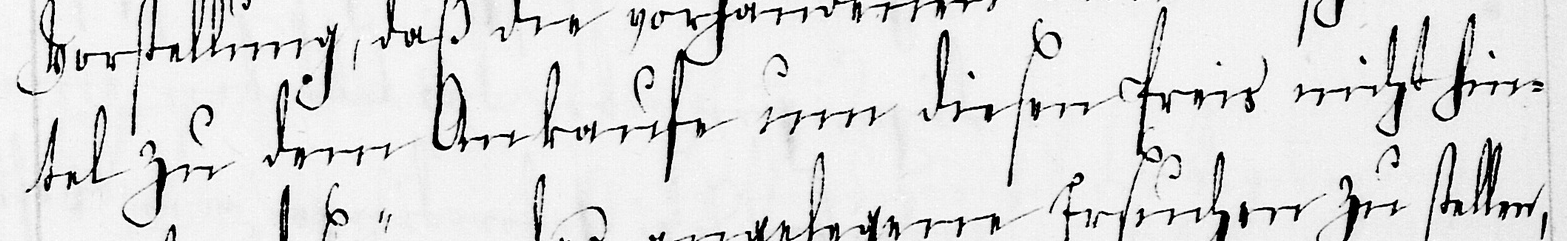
tel zu dem Ankaufe um diesen Preis nicht hin¬
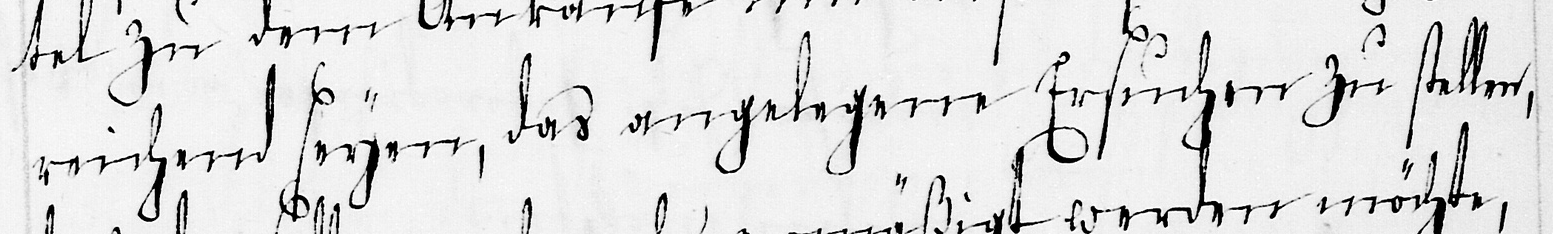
reichend seyen, das angelegene Ersuchen zu stelle¬
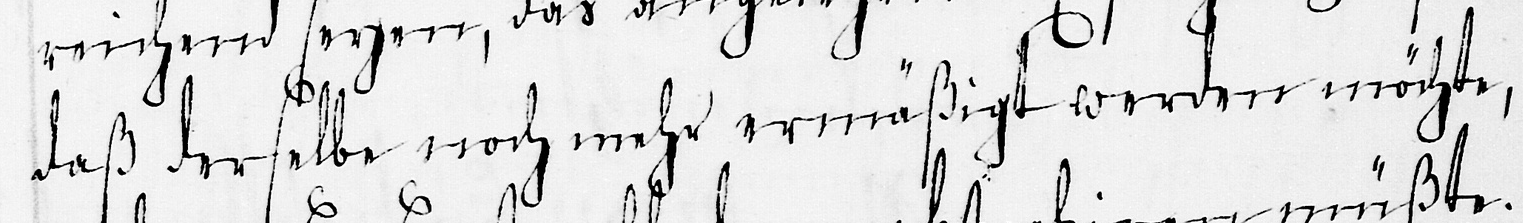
daß derselbe noch mehr ermäßigt werden möchte,
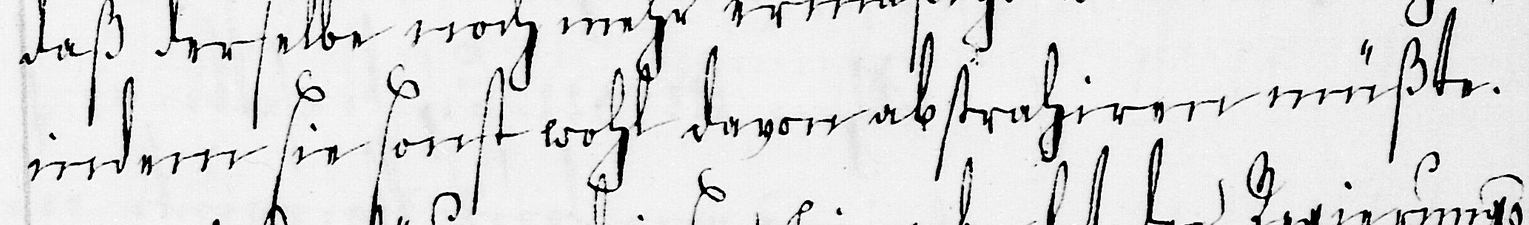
indem sie sonst wohl davon abstrahiren müßte.
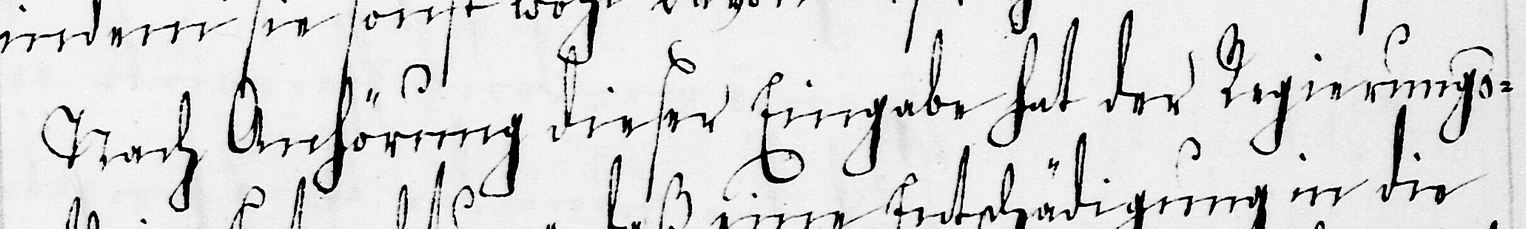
Nach Anhörung dieser Eingabe hat der Regierungs¬
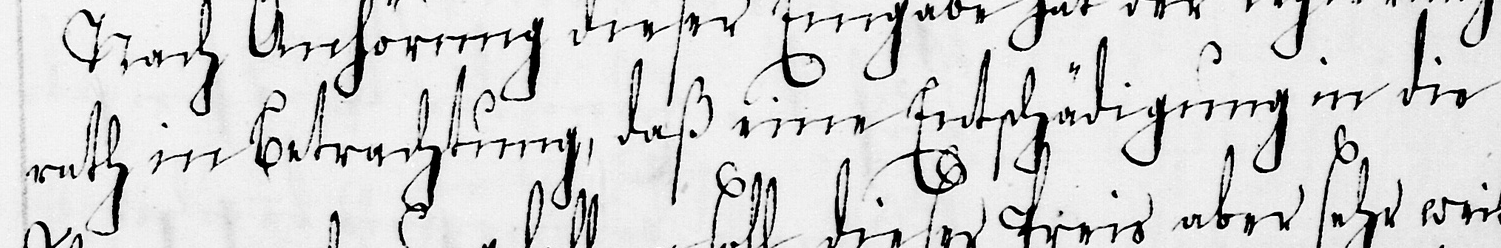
rath in Betrachtung, daß eine Entschädigung in die
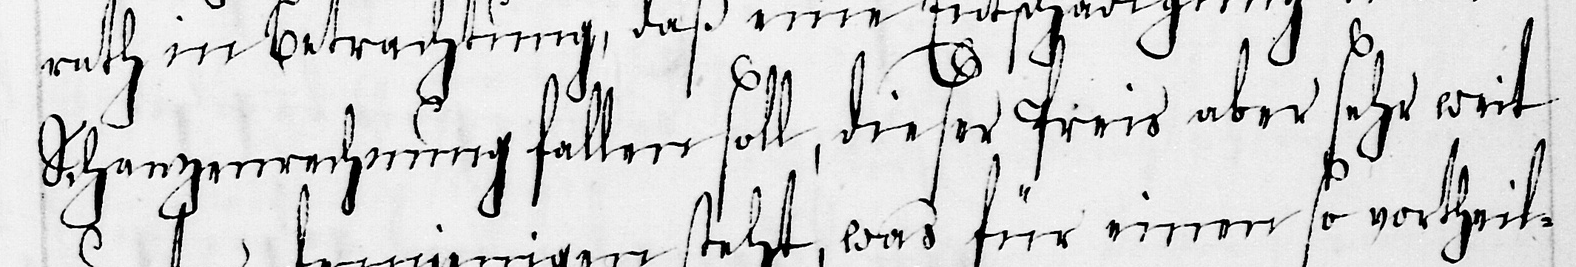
Schanzenrechnung fallen soll, dieser Preis aber sehr weit
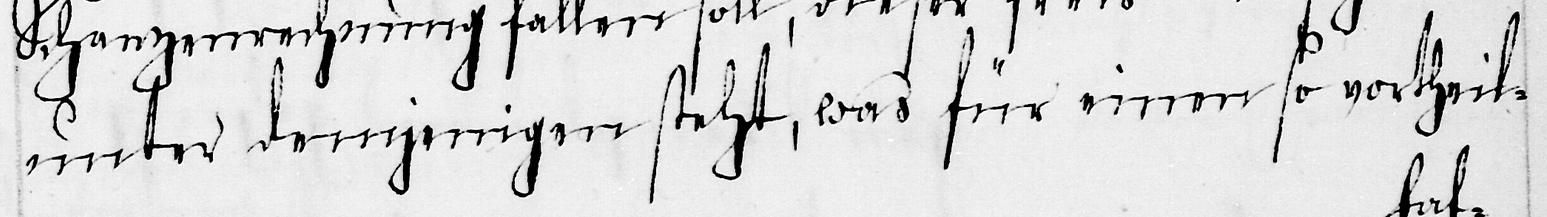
unter demjenigen steht, was für einen so vortheil-
